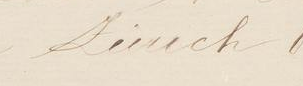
Zürich
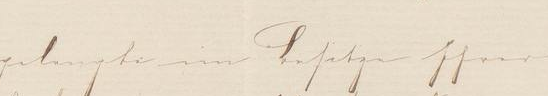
gelangte in Besitze Ihrer
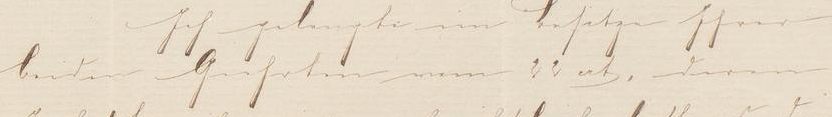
beiden Geehrten vom 22 crt , deren
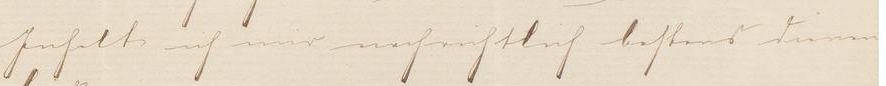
Inhalt ich mir nachrichtlich bestens dienen
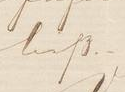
ließ. –
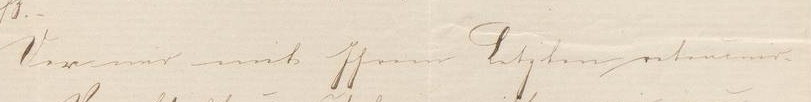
Der mir mit Ihrem Letzten retournir-
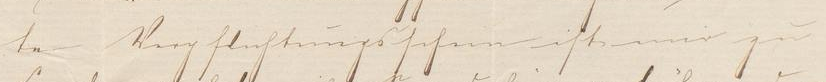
te Verpflichtungsschein ist mir zu
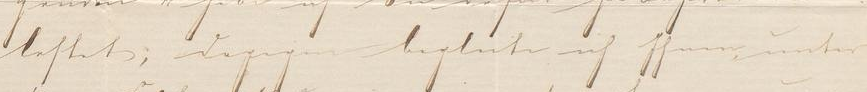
lastet; dagegen begleite ich Ihnen unter
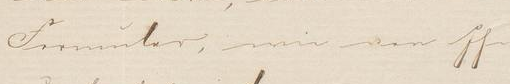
Formular, wie von Ihnen
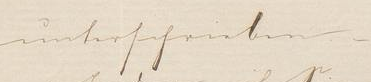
unterschrieben. –
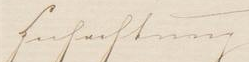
Hochachtung
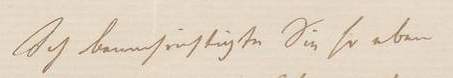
Ich benachrichtigte Sie so eben
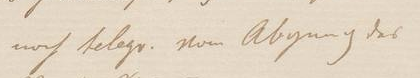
noch telegr. vom Abgang des
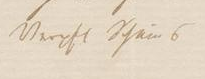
VerpflScheins.
